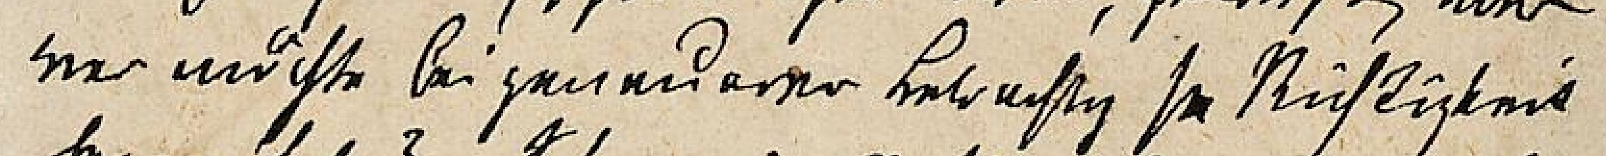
wer möchte bei genauerer Betrachtg sn Richtigkeit
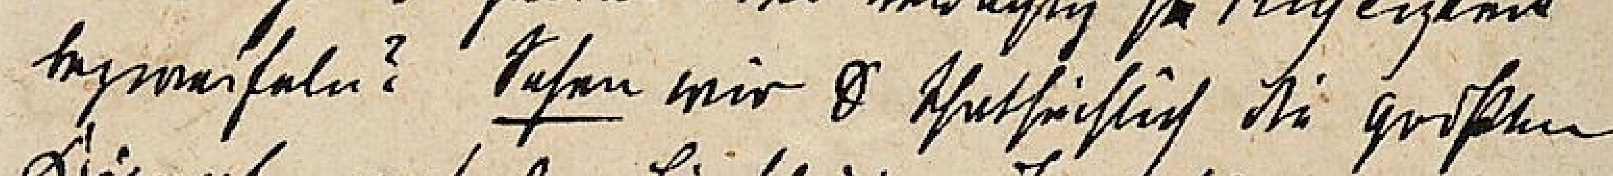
bezweifeln? Sehen wir o thatsächlich die größten
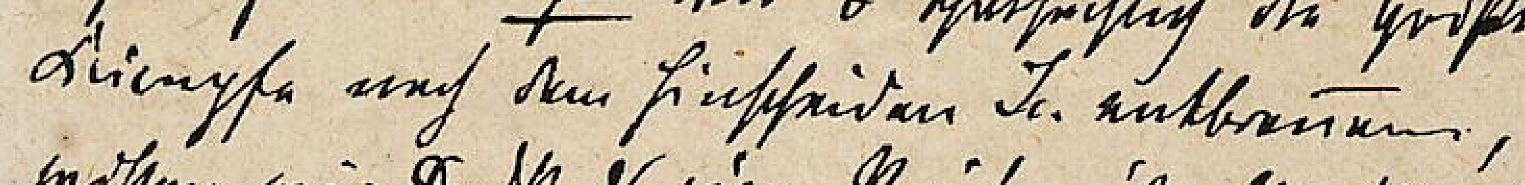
Kämpfe nach dem Hinscheiden J. entbrenen,
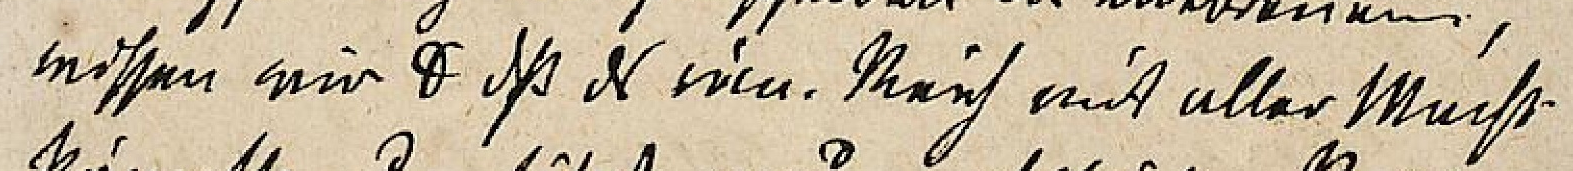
wissen wir o dß ds röm. Reich mit aller Macht
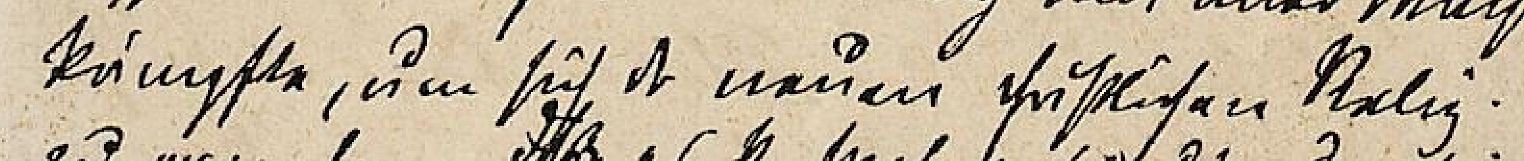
kämpfte, um sich dr neuen christlichen Relig.
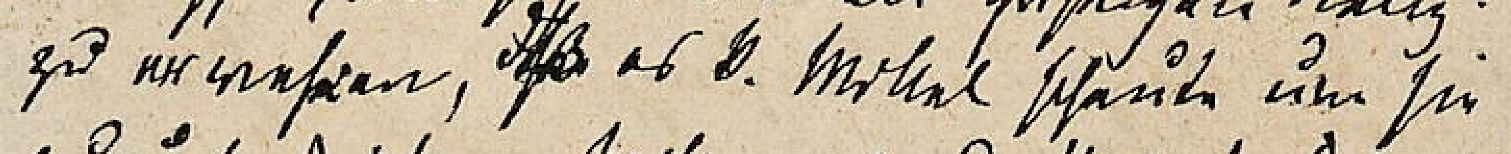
zu erwehren, dß es k. Mittel scheute um sie
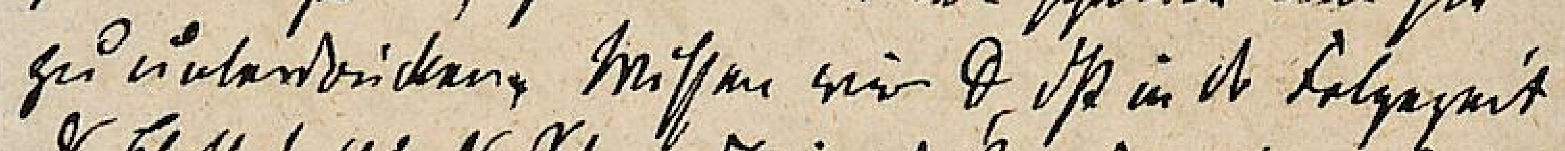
zu unterdrücken. Wissen wir o, dß in dr Folgezeit
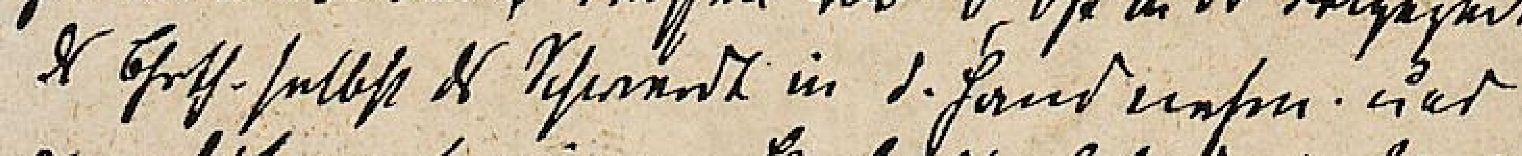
ds Chrth selbst ds Schwerdt in d. Hand nahm und
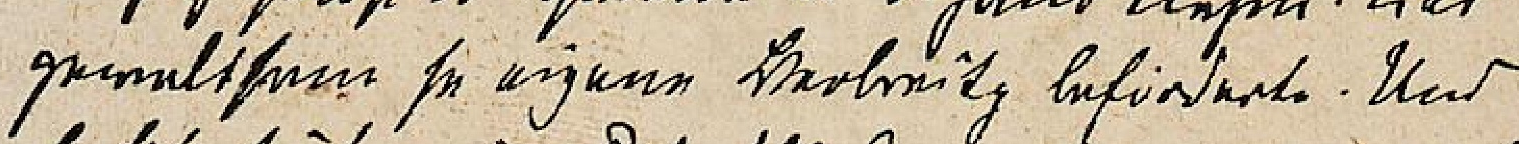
gewaltsam sn eigene Verbreitg beförderte. Und
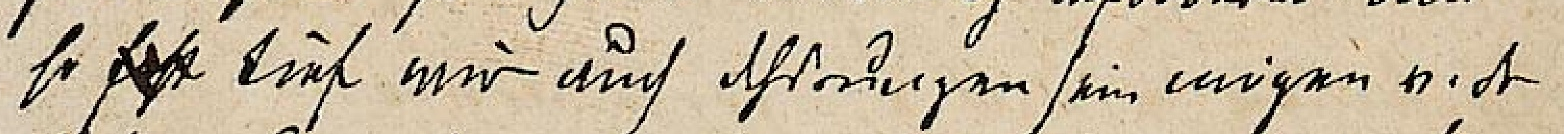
so fest tief wir auch dhdrungen sein mögen v. dr
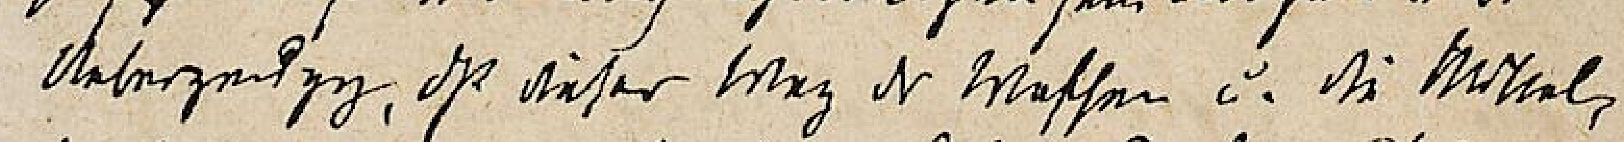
Ueberzeugg, dß dieser Weg dr Waffen u. die Mittel,
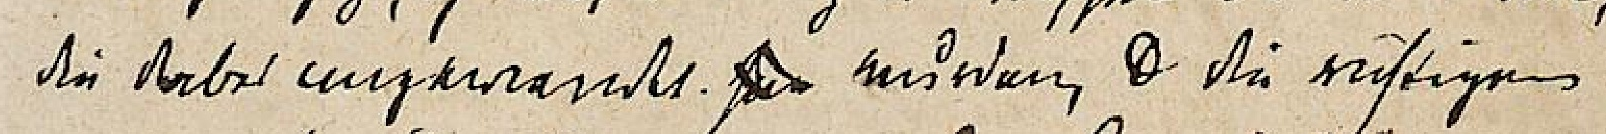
die dabei ungewandt sein wurden, o die richtigen
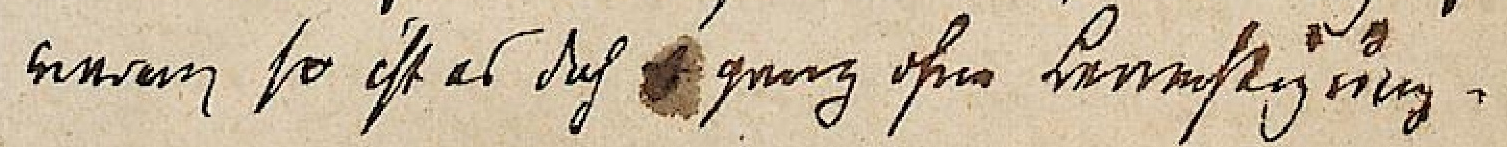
waren, so ist es doch ganz ohne Berechtigung
